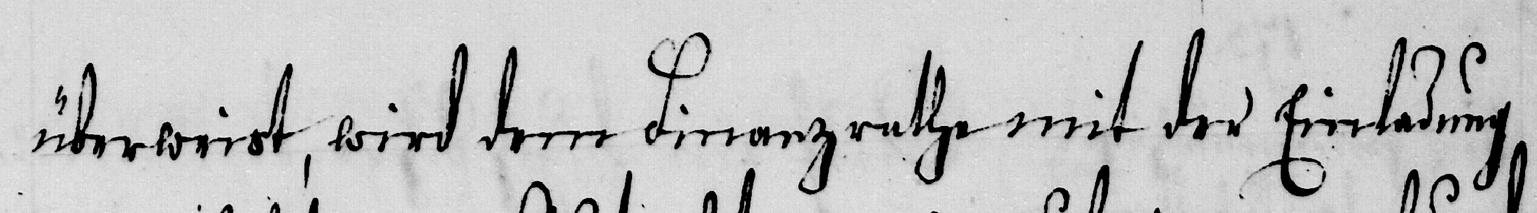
überweist, wird dem Finanzrathe mit der Einladung
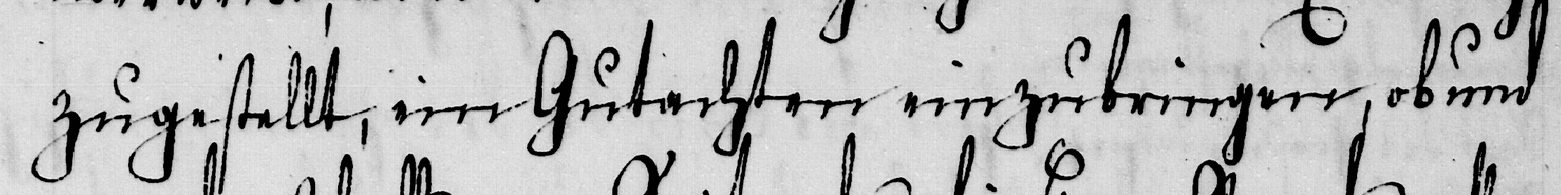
zugestellt, ein Gutachten einzubringen, ob und
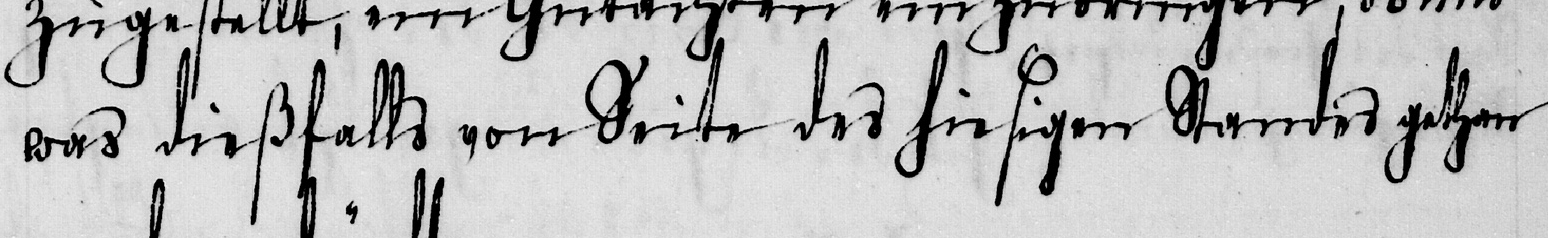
was dießfalls von Seite des hiesigen Standes gethan
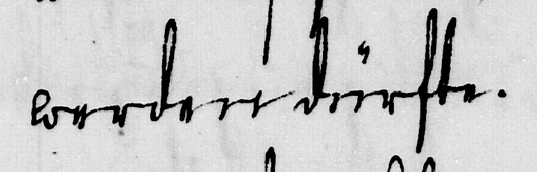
werden dürfte.
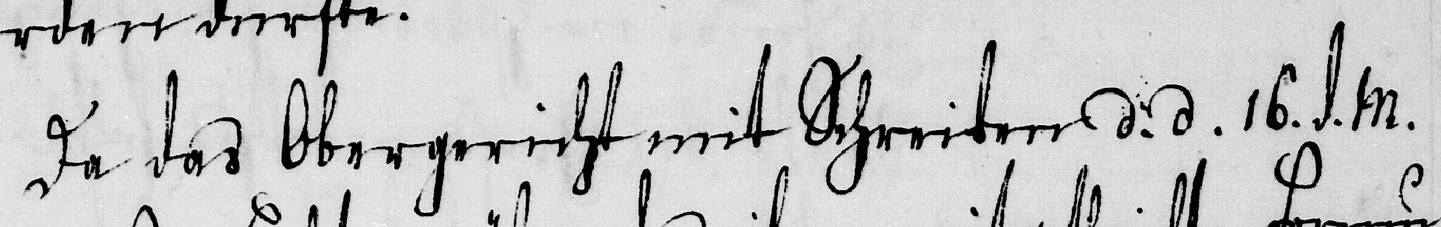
Da das Obergericht mit Schreiben d. d. 16. d. M.
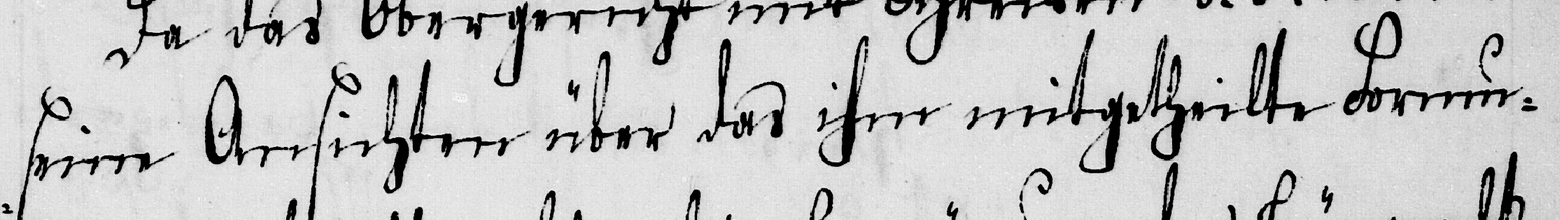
seine Ansichten über das ihm mitgetheilte Formu¬
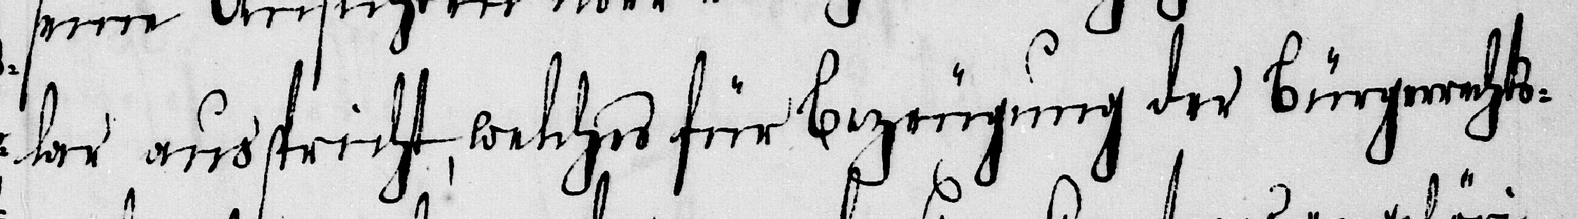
lar ausspricht, welches für Bezeugung der Bürgerrecht¬
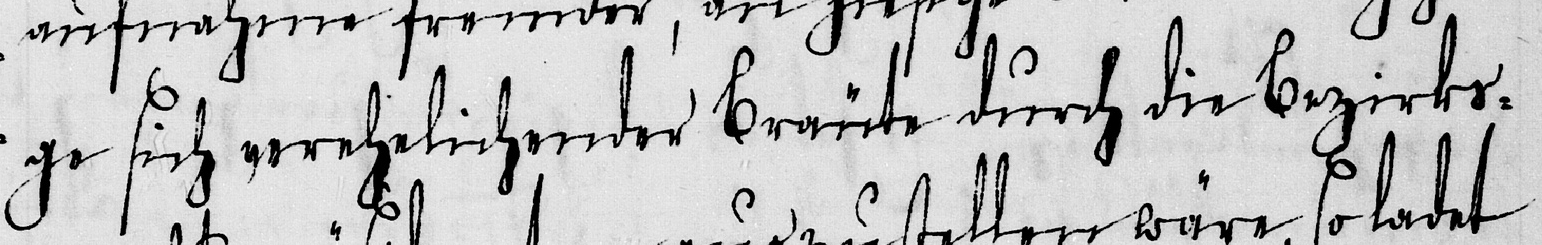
ge sich verehelichender Bräute durch die Bezirks¬
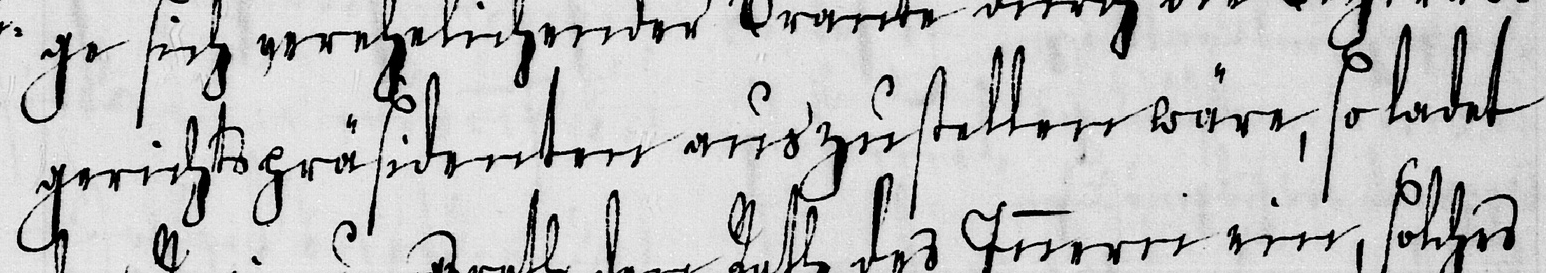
gerichtspräsidenten auszustellen wäre, so ladet
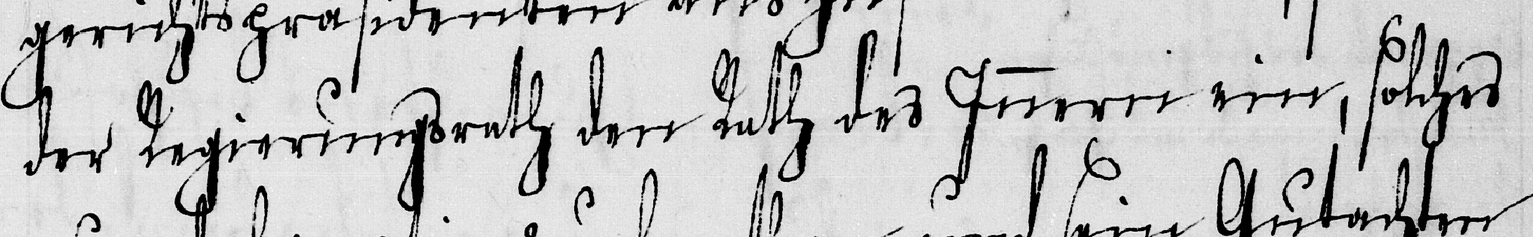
der Regierungsrath den Rath des Innern ein, solches
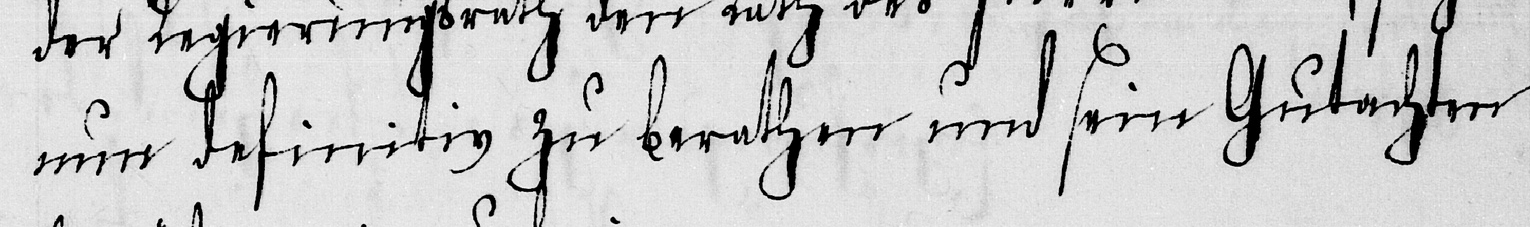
nun definitiv zu berathen und sein Gutachten
